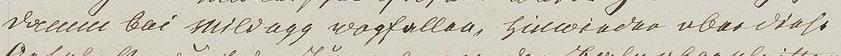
Damm bei Wildegg wegfallen, hinwieder aber diese
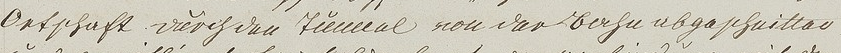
Ortschaft durch den Tunnel von der Bahn abgeschnitten
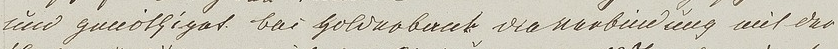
und genöthiget bei Holderbank die Verbindung mit der
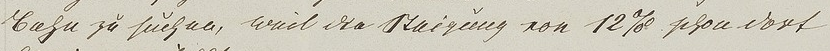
Bahn zu suchen, weil die Steigung von 12‰ schon dort
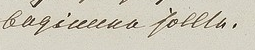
beginnen sollte.
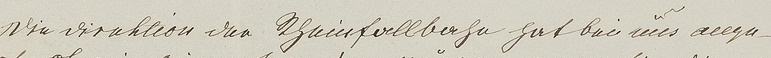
Die Direktion der Rheinfallbahn hat bei uns ange-
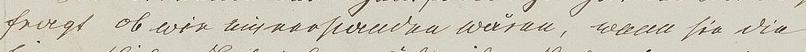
fragt ob wir einverstanden wären, wenn sie die
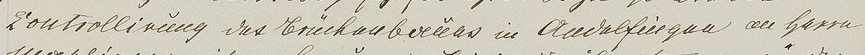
Controllirung des Brückenbaues in Andelfingen an Herrn
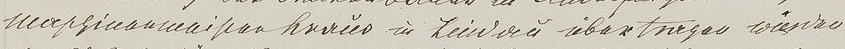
Maschinenmeister Kraus in Lindau übertragen würden.
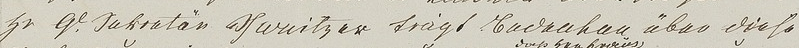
Hr. GlSekretär Schweitzer trägt Bedenken über diese
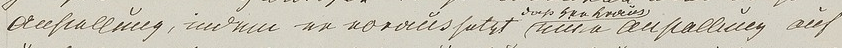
Anstellung, indem er voraussetzt dass Her Kraus eine Anstellung auf
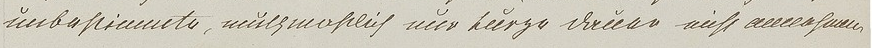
unbestimmte, muthmasslich nur kurze Dauer nicht annehmen
